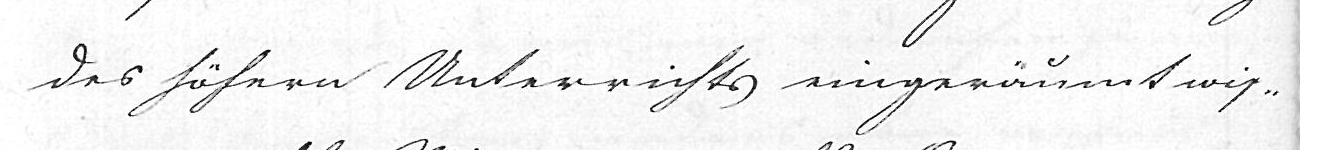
des höhern Unterrichts eingeräumt wis-
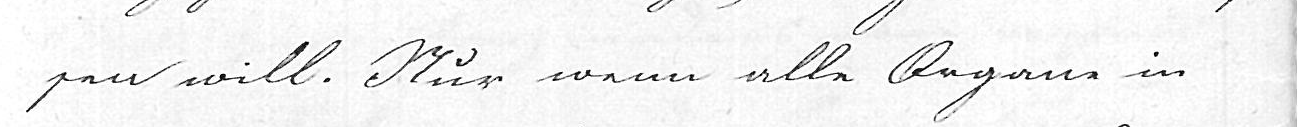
sen will. Nur wenn alle Organe in
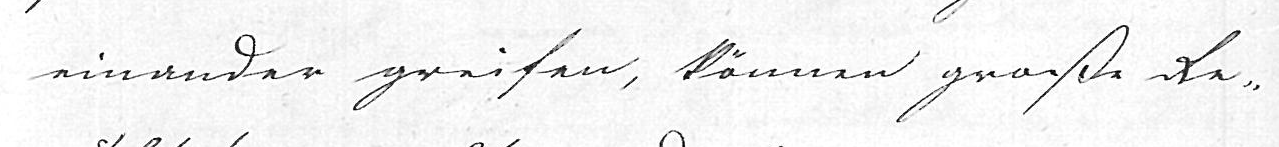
einander greifen, können große Re-
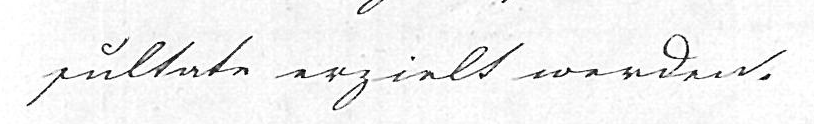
sultate erzielt werden.
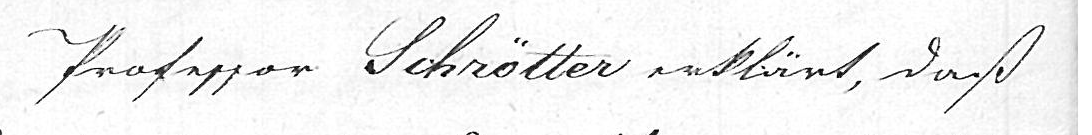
Professor Schrötter erklärt, daß
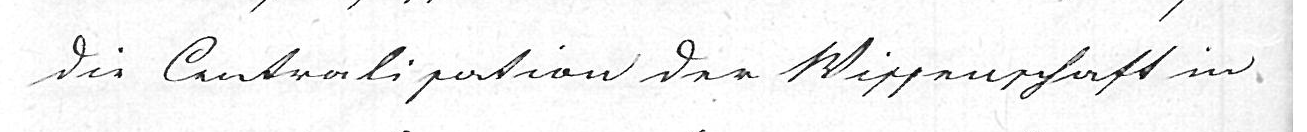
die Centralisation der Wissenschaft in
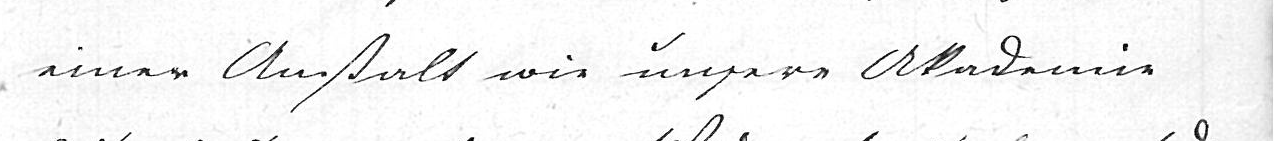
einer Anstalt wie unsere Akademie
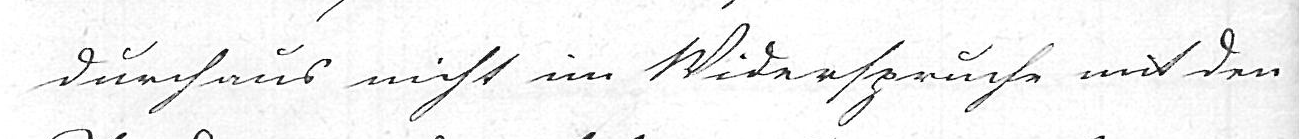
durchaus nicht im Widerspruche mit den
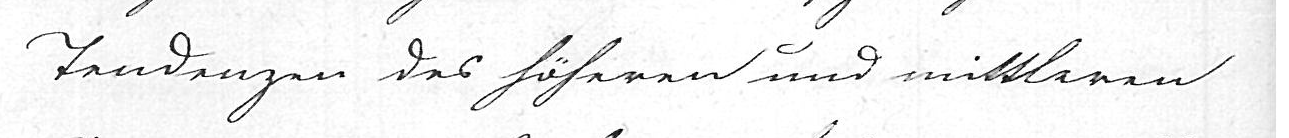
Tendenzen des höheren und mittleren
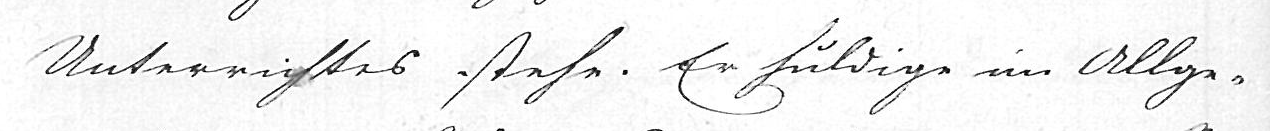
Unterrichtes stehe. Er huldige im Allge-
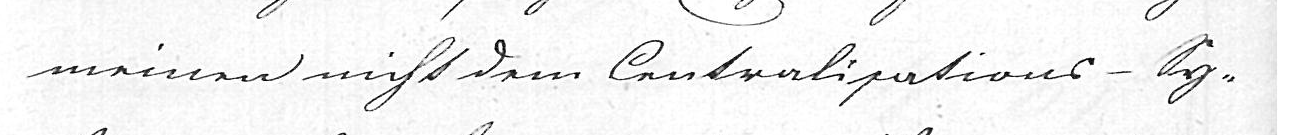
meinen nicht dem Centralisations-Sy-
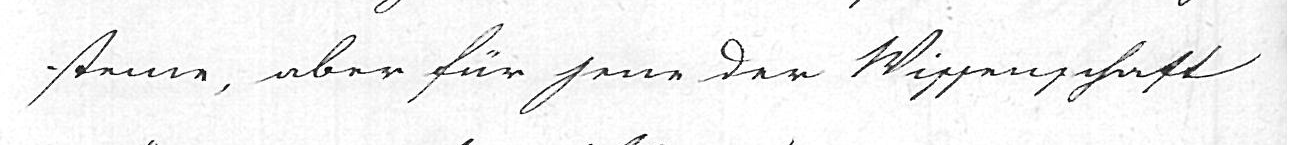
steme, aber für jene der Wissenschaft
